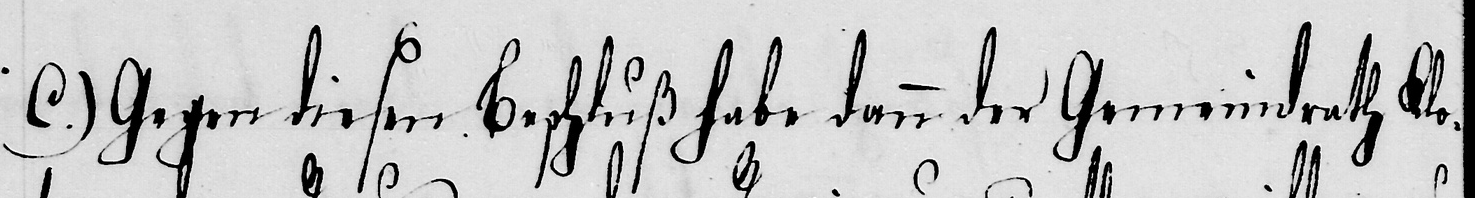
C.) Gegen diesen Beschluß habe dann der Gemeindrath Kl¬
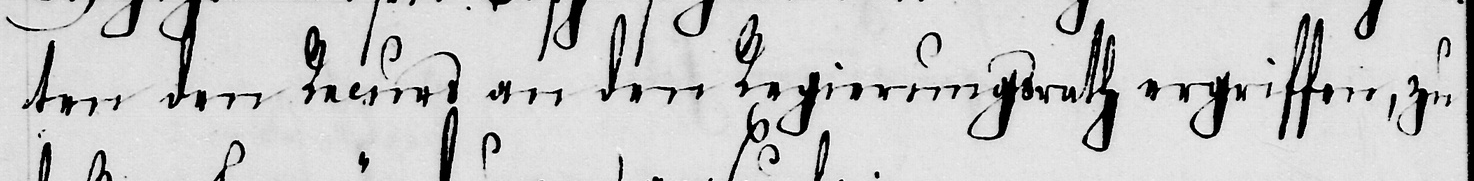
oten den Recrus an den Regierungsrath ergriffen, zu
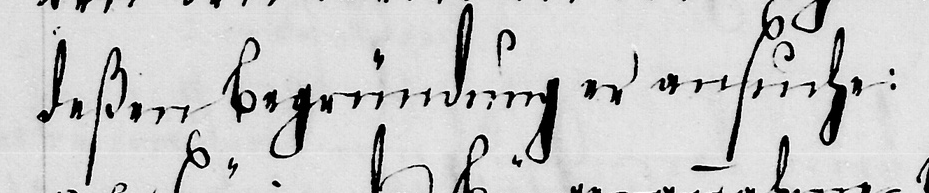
deßen Begründung er ansuche:
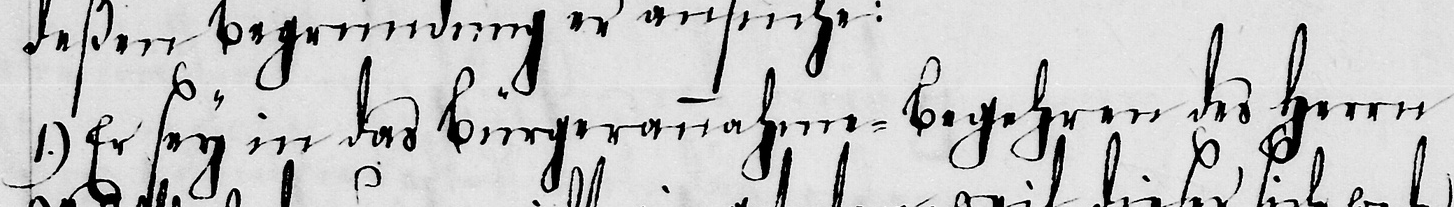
1.) Er sey in das Bürgerannahme-Begehren des Herrn
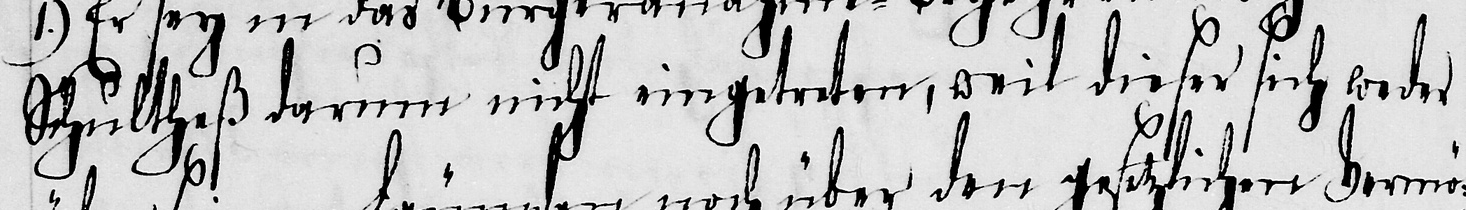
Schultheß darum nicht eingetreten, weil dieser sich weder
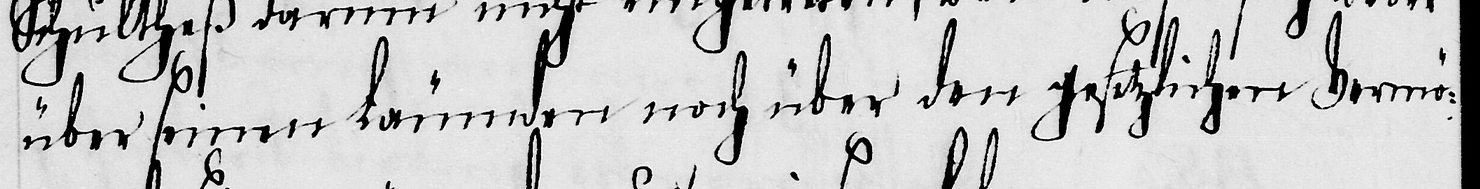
über seinen Läumden noch über den gesetzlichen Vermö¬
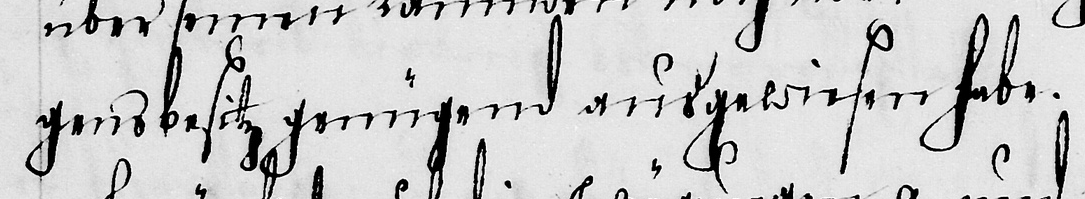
gensbesitz genügend ausgewiesen habe.
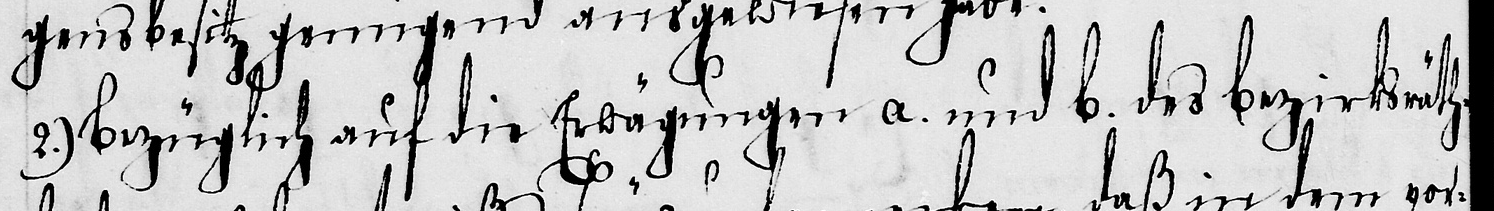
2.) Bezüglich auf die Erwägungen a. und b. des bezirksräth¬
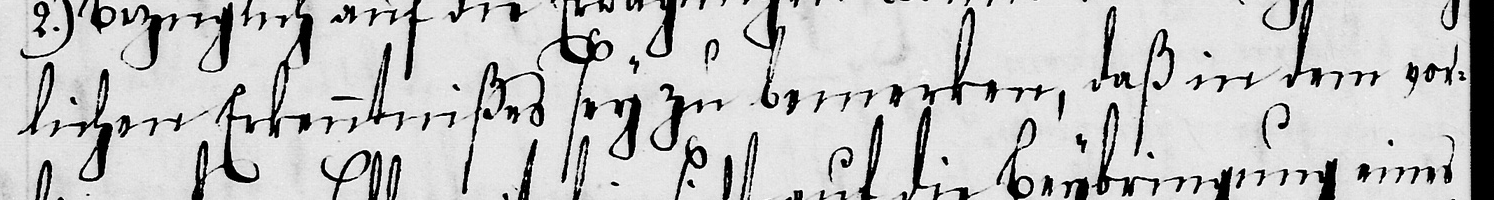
lichen Erkenntnißes sey zu bemerken, daß in dem vor¬
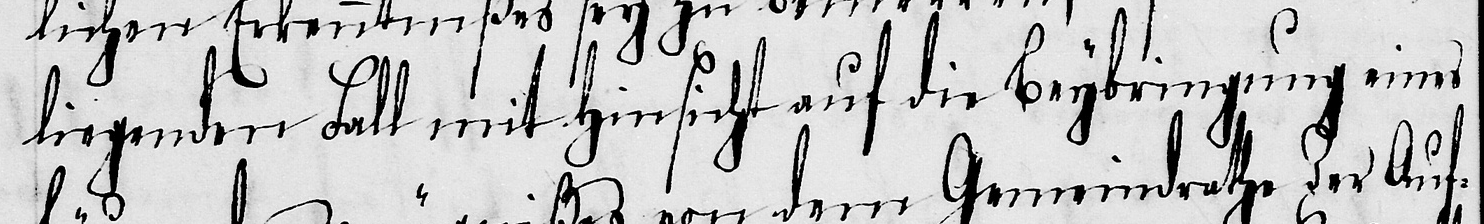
liegenden Fall mit Hinsicht auf die Beybringung eines
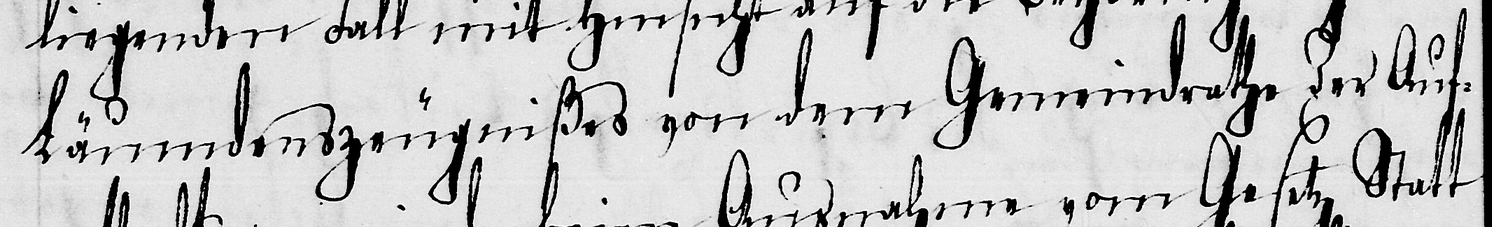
Läumdenszeugnißes von dem Gemeindrathe der Auf¬
